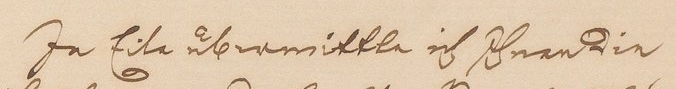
In Eile übermittle ich Ihnen die
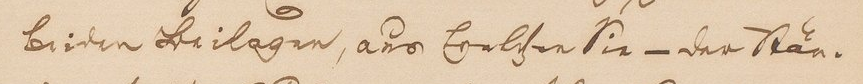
beiden Beilagen, aus welchen Sie – der Stän-
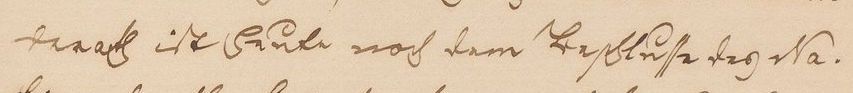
derath ist heute noch dem Beschlusse des Na-
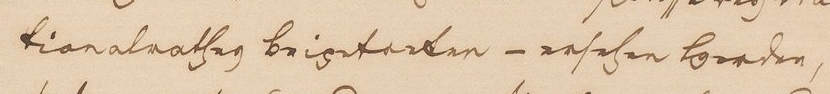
tionalrathes beigetreten – ersehen werden,
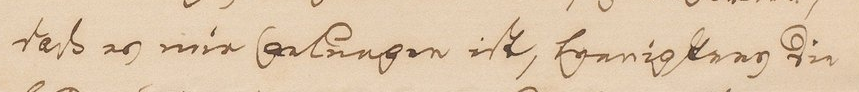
daß es mir gelungen ist, wenigstens die
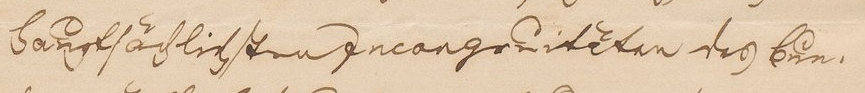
hauptsächlichsten Incongruitäten des bun-
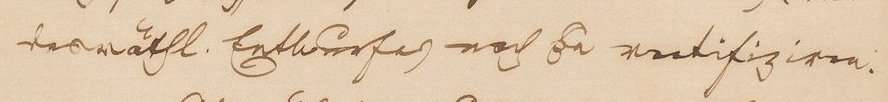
desräthl. Entwurfes noch zu rectifiziren.
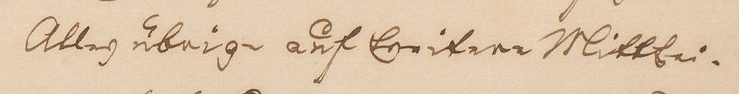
Alles übrige auf weitere Mitthei-
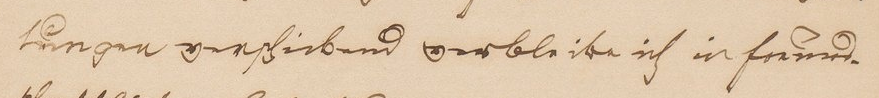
lungen verschiebend verbleibe ich in freund-
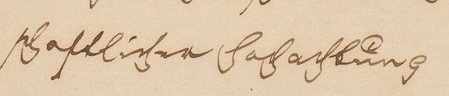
schaftlicher Hochachtung
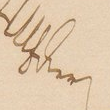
Bern
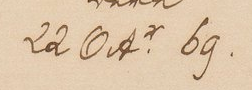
22 Octr 69.
